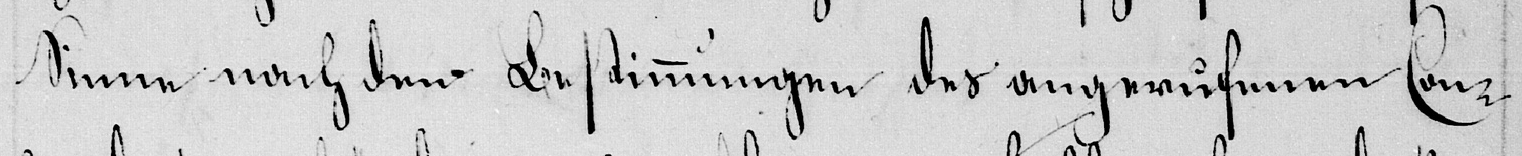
Sinne nach den Bestimmungen des angerufenen Con¬
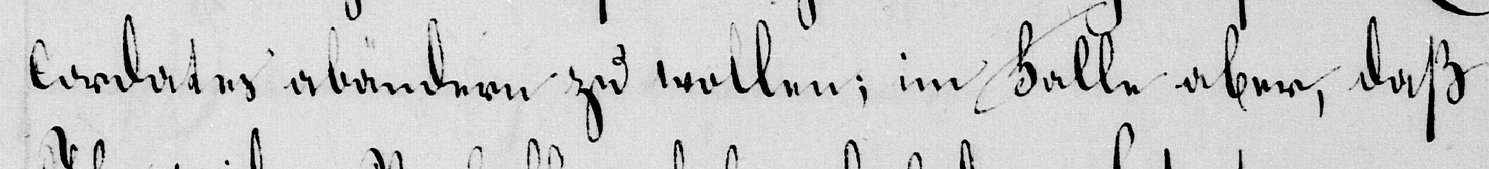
cordates abändern zu wollen; im Falle aber, daß
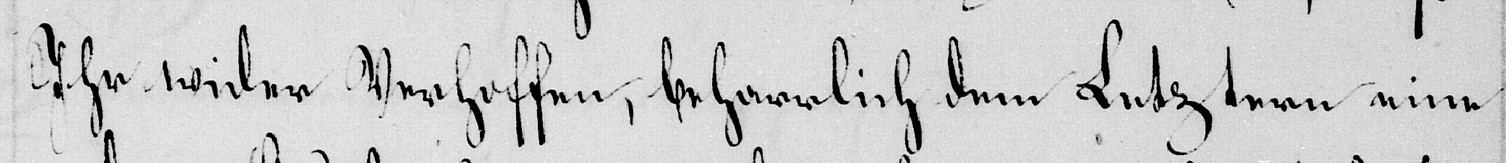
Ihr wider Verhoffen, beharrlich dem Letztern eine
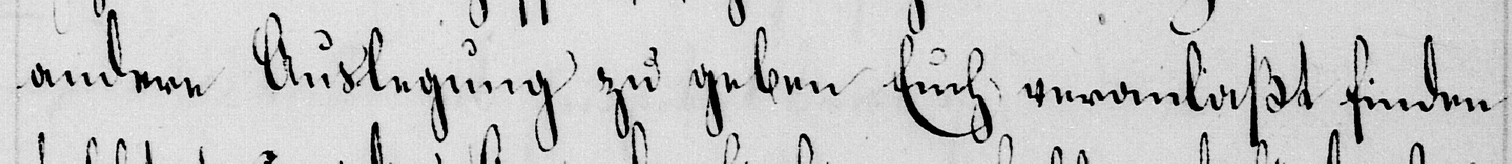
andere Auslegung zu geben Euch veranlaßt finden
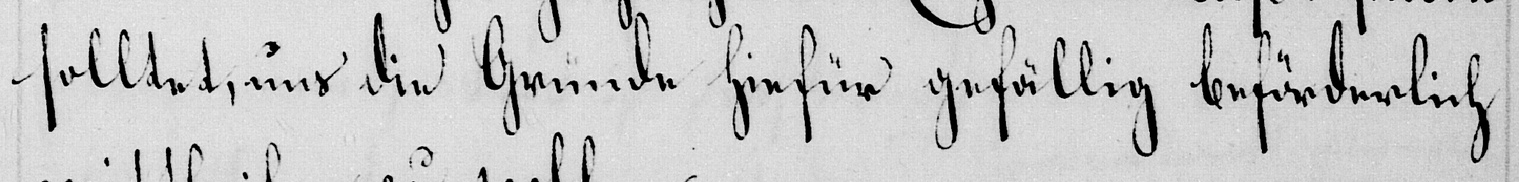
solltet, uns die Gründe hiefür gefällig beförderlich
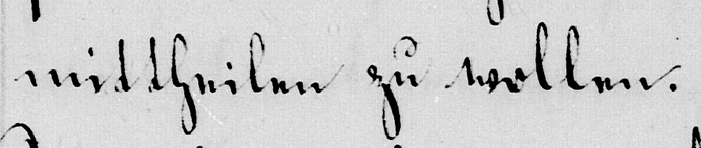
mittheilen zu wollen.
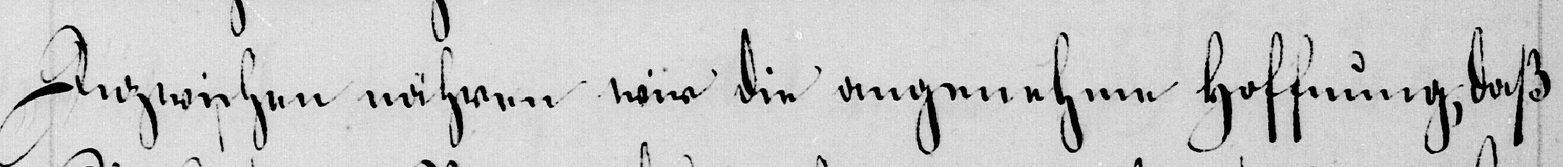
Inzwischen nähren wir die angenehme Hoffnung, daß
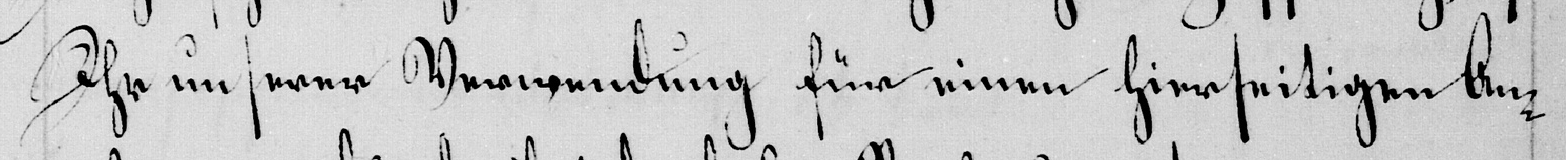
Ihr unserer Verwendung für einen hierseitigen An¬
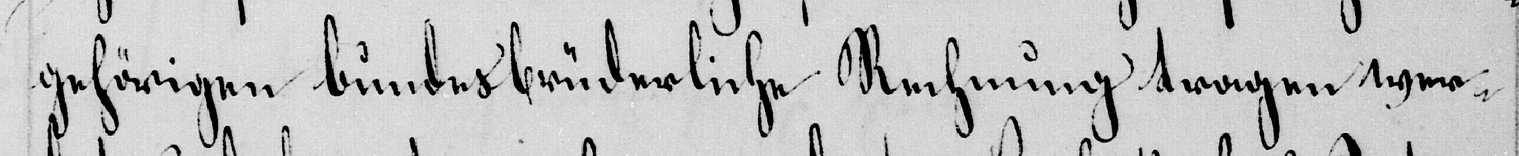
gehörigen bundesbrüderliche Rechnung tragen wer¬
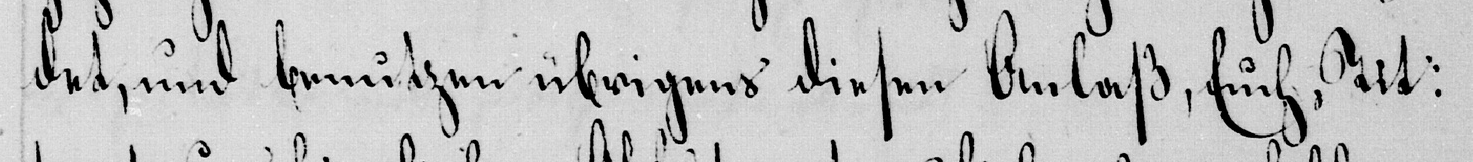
det, und benutzen übrigens diesen Anlaß, Euch, Tit:
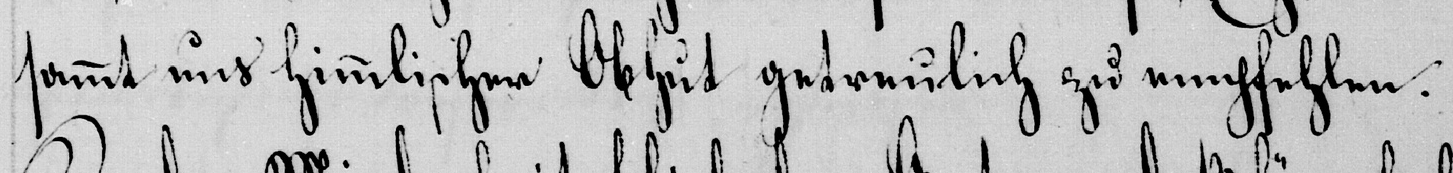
sammt uns himmlischer Obhut getreulich zu empfehlen.
